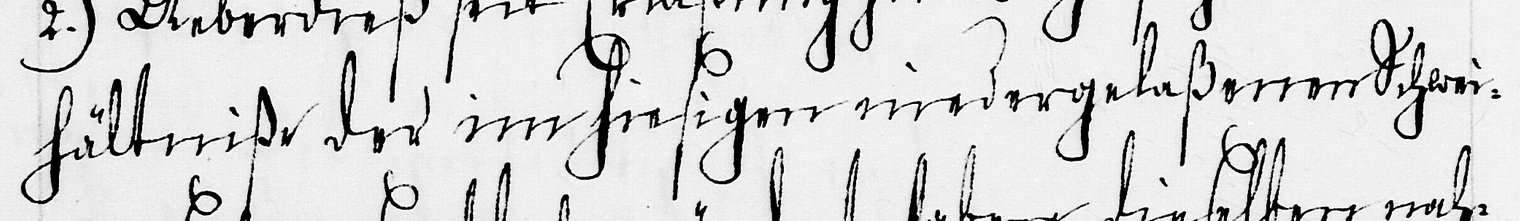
hältniße der im hiesigen niedergelaßenen Schwei¬
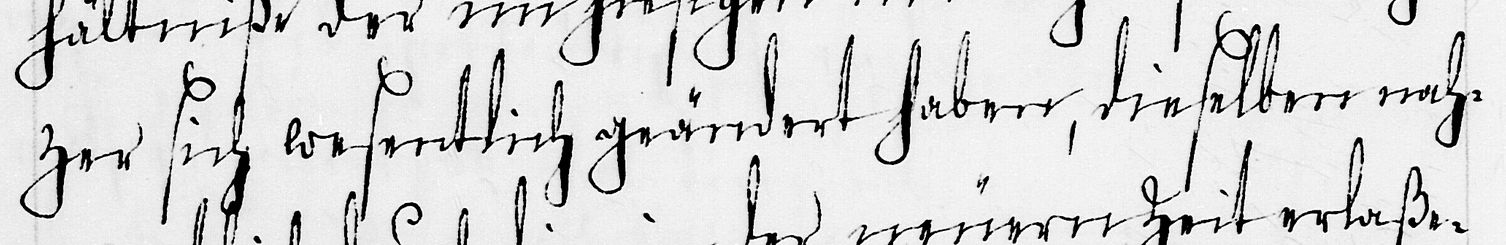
zer sich wesentlich geändert haben, dieselben nah¬
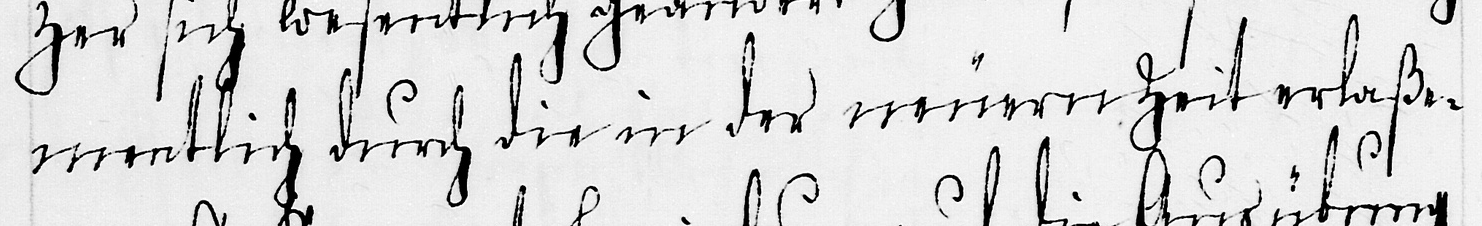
mentlich durch die in der neuern Zeit erlaße¬
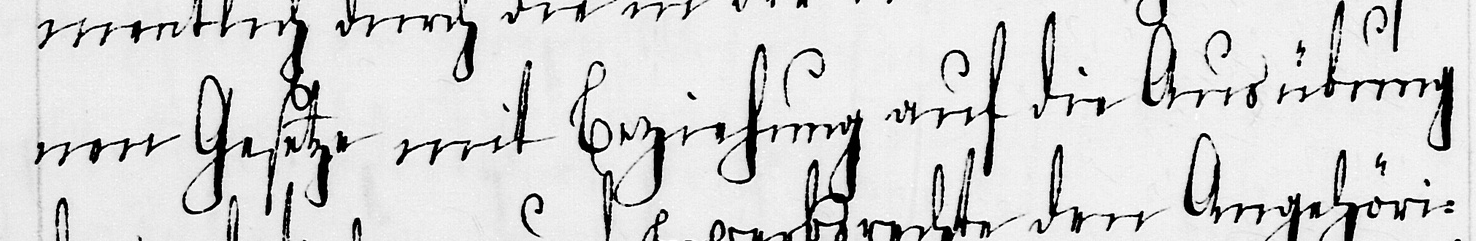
nen Gesetze mit Beziehung auf die Ausübung
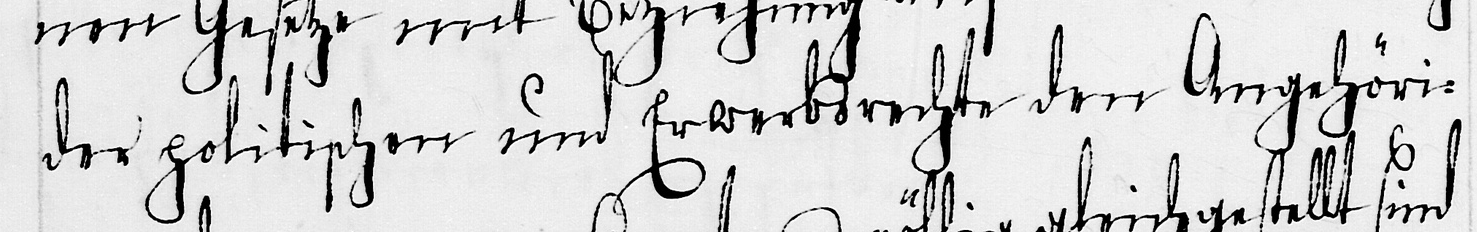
der politischen und Erwerbsrechte den Angehöri¬
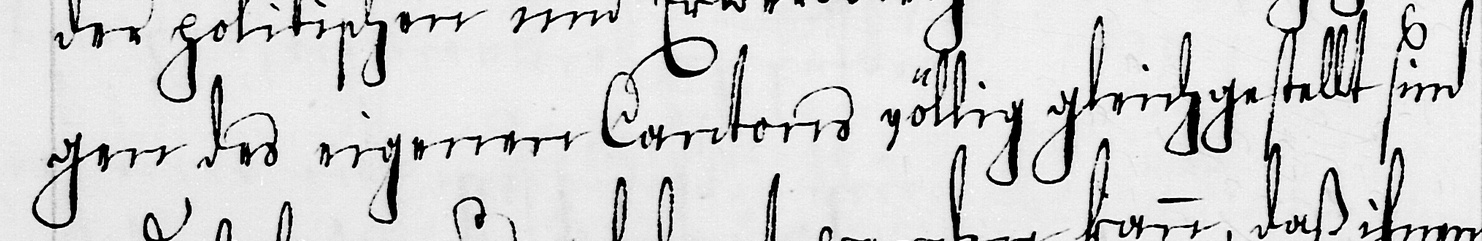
gen des eigenen Cantons völlig gleichgestellt sind
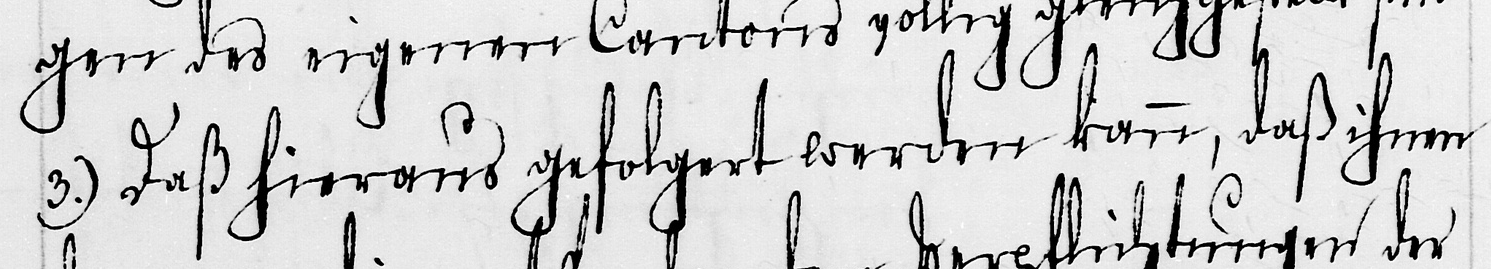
3.) Daß hieraus gefolgert werden kann, daß ihnen
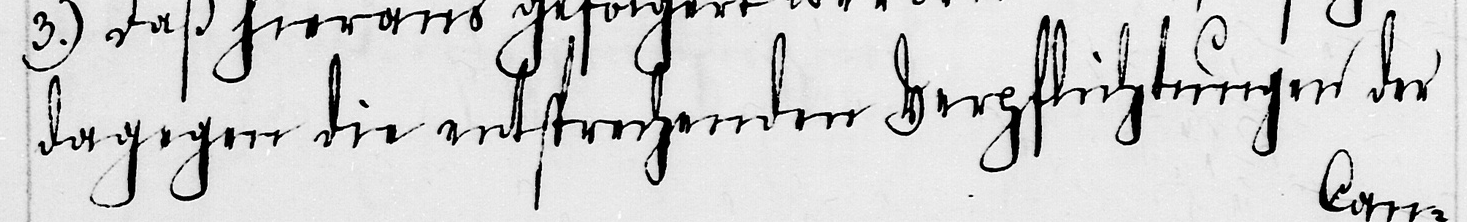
dagegen die entsprechenden Verpflichtungen der
